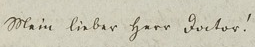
Mein lieber Herr Doctor!
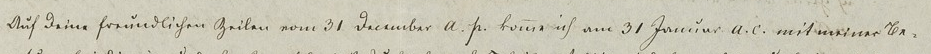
Auf Deine freundlichen Zeilen vom 31 December a. p. komme ich am 31 Januar a. c. mit einer Be-
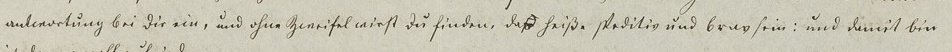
antwortung bei Dir ein, und ohne Zweifel wirst Du finden, daßs heiße speditiv und brav sein: und damit bin
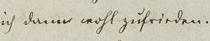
ich dann wohl zufrieden.
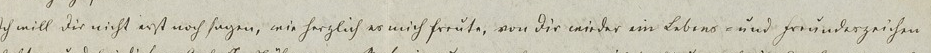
Ich will Dir nicht erst noch sagen, wie herzlich es mich freute, von Dir wieder ein Lebens- und Freundeszeichen
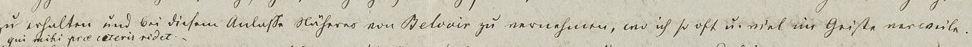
zu erhalten und bei diesem Anlasse Näheres von Belvoir zu vernehmen, wo ich so oft u. viel im Geiste verweile.
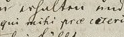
qui mihi præ ceteris
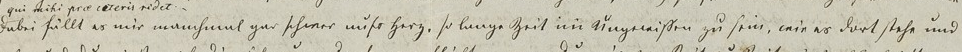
Dabei fällt es mir manchmal gar schwer aufs Herz, so lange Zeit im Ungewissen zu sein, wie es dort stehe und
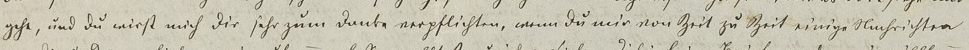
gehe, und Du wirst mich Dir sehr zum Danke verpflichten, wenn Du mir von Zeit zu Zeit einige Nachrichten
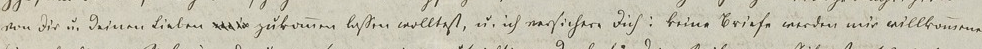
von Dir u. Deinen Lieben mir zukommen lassen wolltest, u. ich versichere Dich: keine Briefe werden mir willkommener
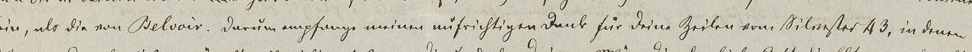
sein, als die von Belvoir. Darum empfange meinen aufrichtigen Dank für Deine Zeilen vom Silvester 43, in denen
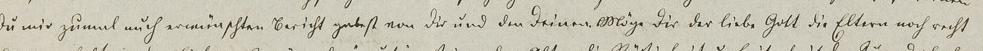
Du mir zumal auch erwünschten Bericht gabest von Dir und den Deinen. Möge Dir der liebe Gott die Eltern noch recht
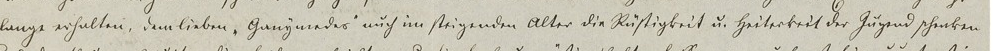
lange erhalten, dem lieben «Ganymedes» auch im steigenden Alter die Rüstigkeit u. Heiterkeit der Jugend schenken
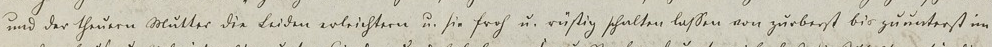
und der theuern Mutter die Leiden erleichtern u. sie froh u. rüstig schalten lassen von zuoberst bis zuunterst im
